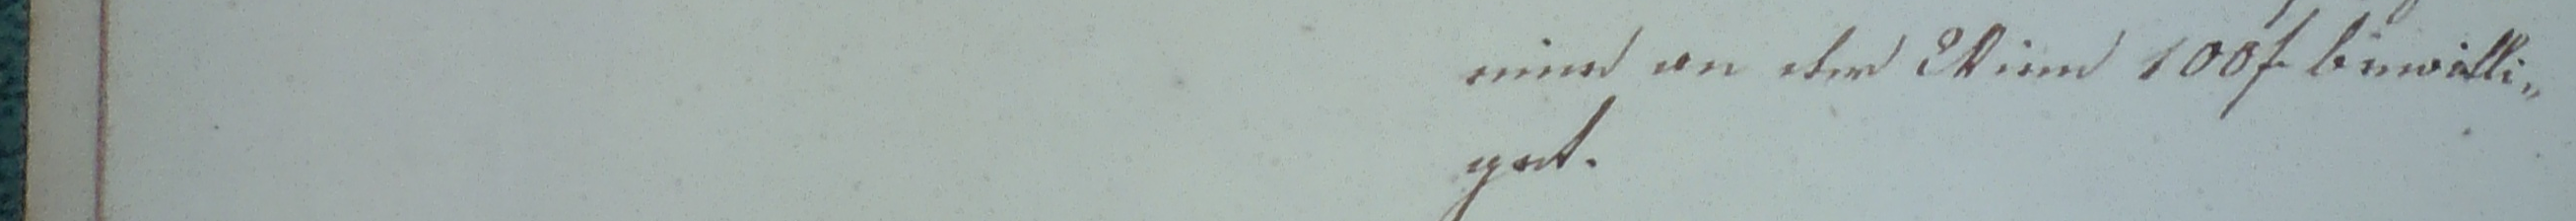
eine an der Wien 100fn bewilli¬
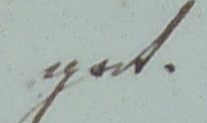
get.
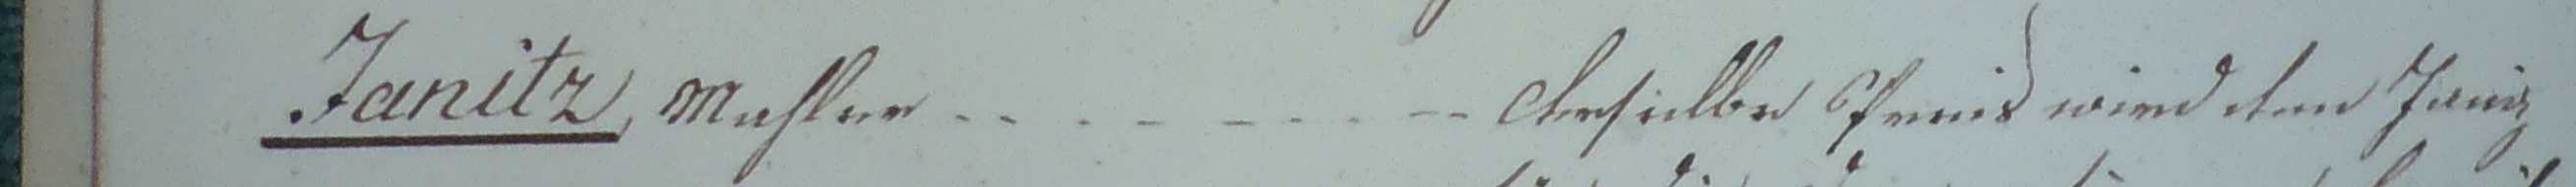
Janitz, Mahler ……… Derselbe Preis wird dem Janiz
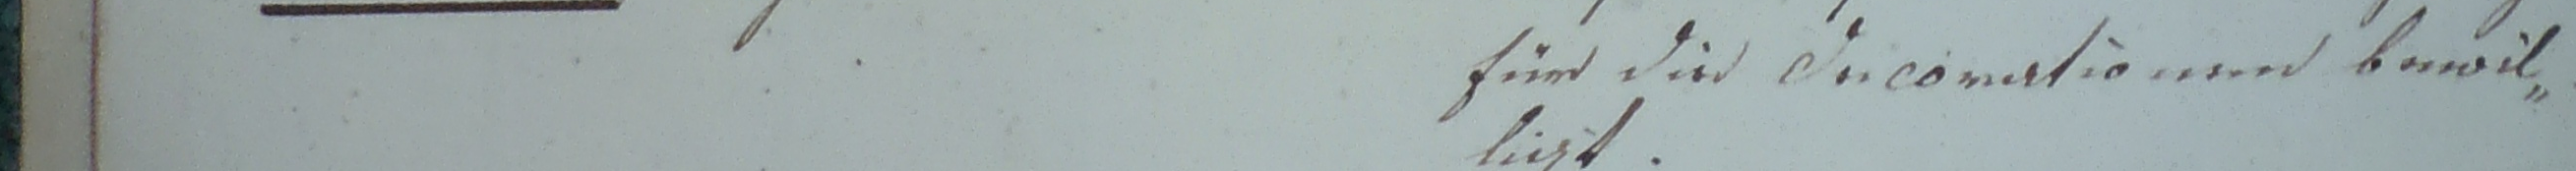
für die Decorationen bewil¬
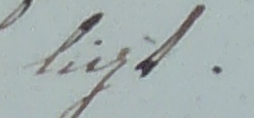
ligt.
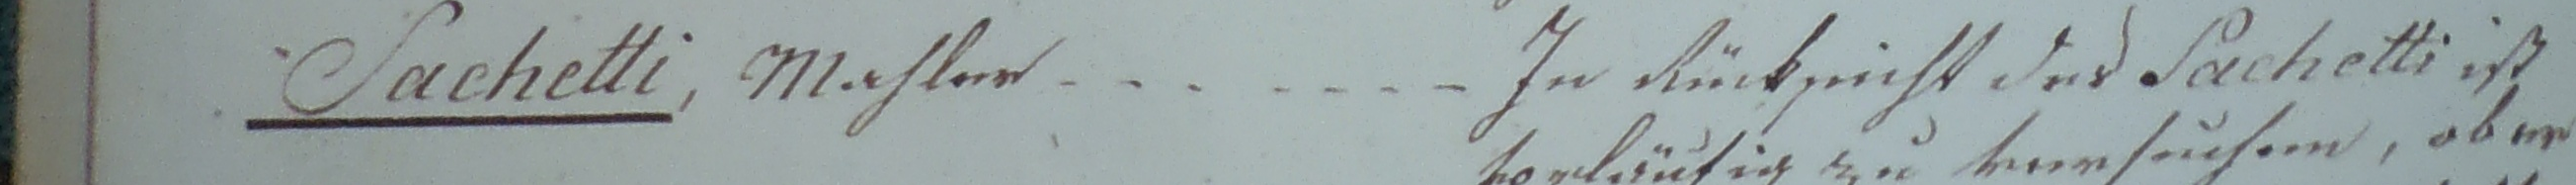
Sachetti, Mahler ……. In Rücksicht des Sachetti ist
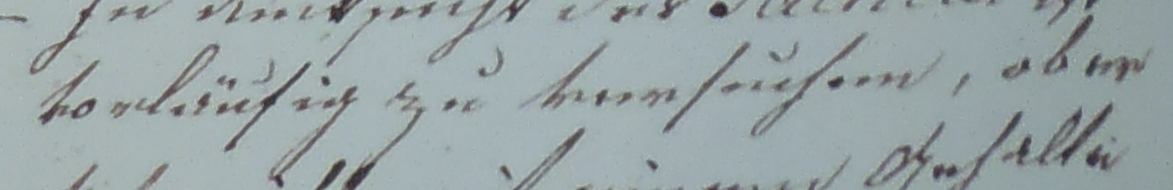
vorläufig zu versuchen, ob er
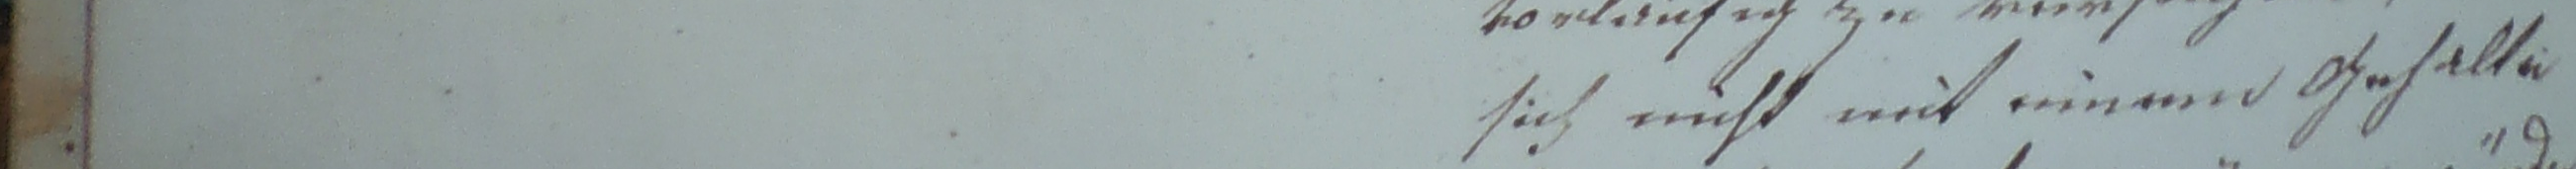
sich nicht mit einem Gehalte
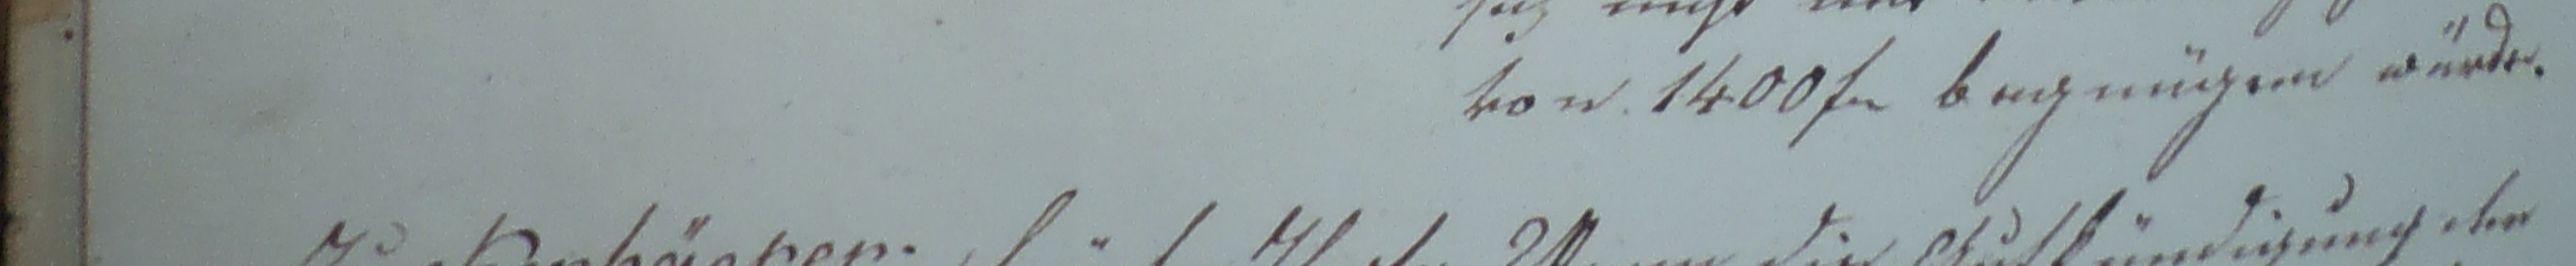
von 1400fn begnügen würde.
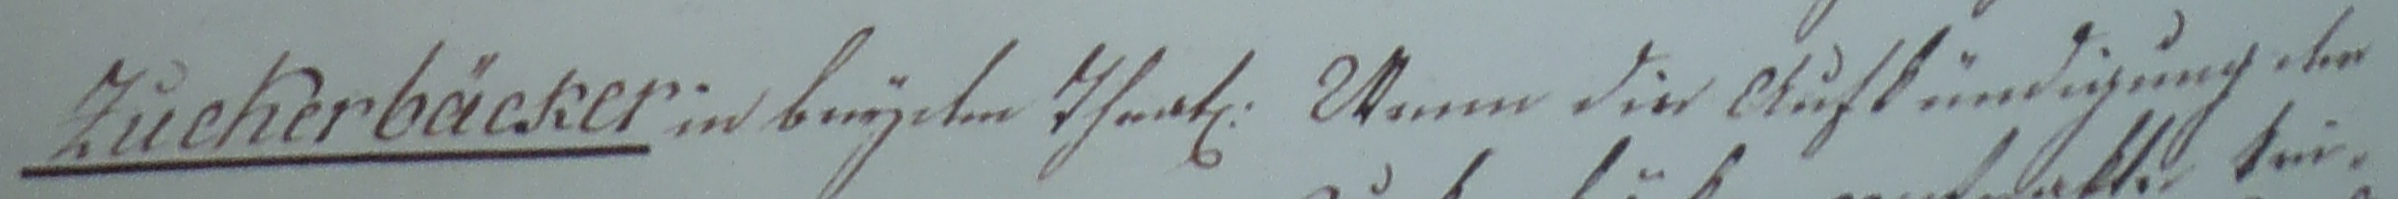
Zuckerbäcker in beyden TheatE: Wenn die Aufkündigung der
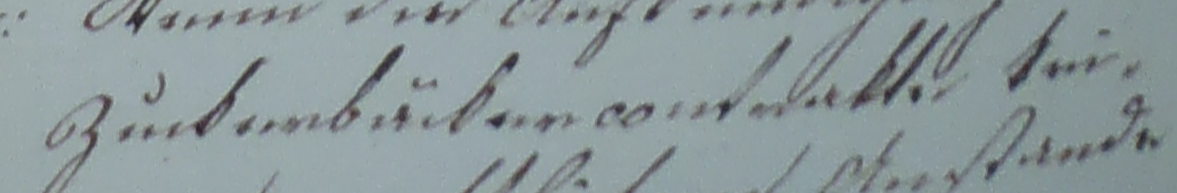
Zuckerbäckercontrakte kei¬
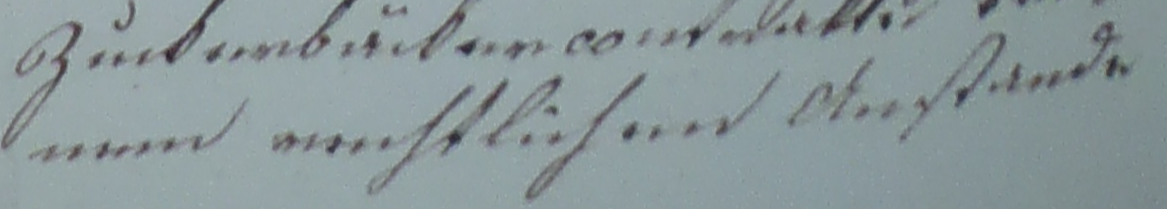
nem amtlichen Anstande
